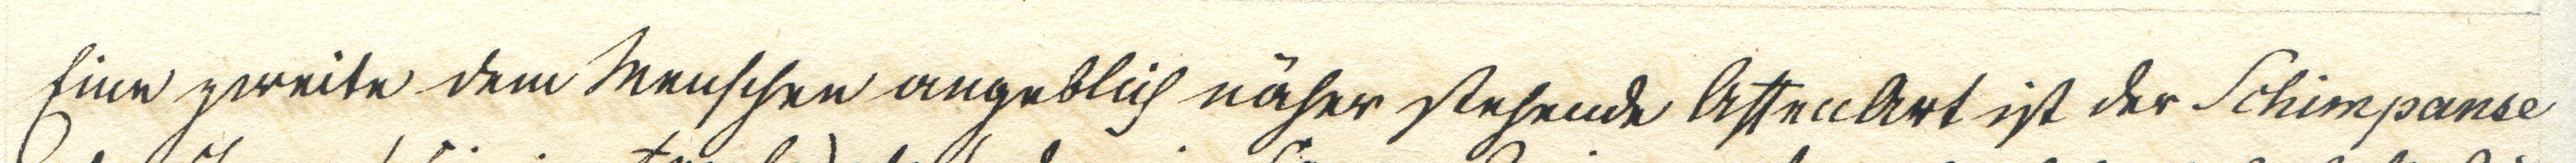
Eine zweite dem Menschen angeblich näher stehende AffenArt ist der Schimpanse,
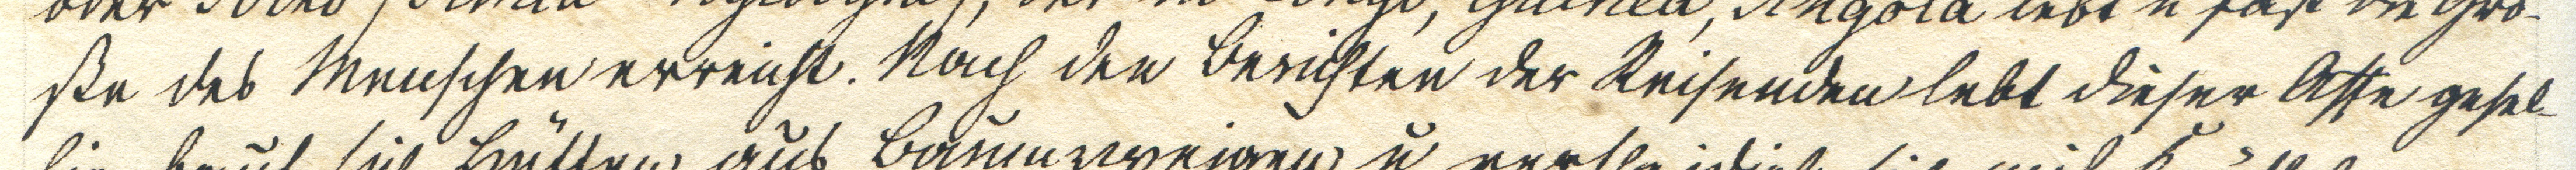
ße des Menschen erreicht. Nach den Berichten der Reisenden lebt dieser Affe gesel-
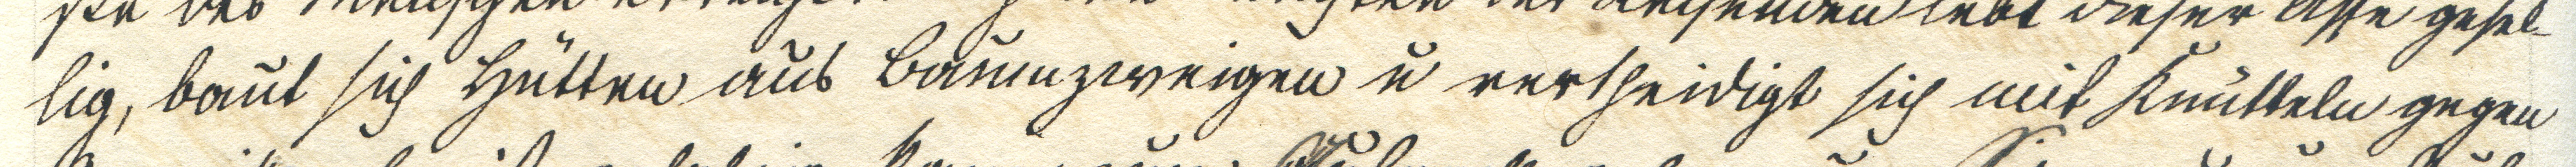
lig, baut sich Hütten aus Baumzweigen u vertheidigt sich mit Knütteln gegen
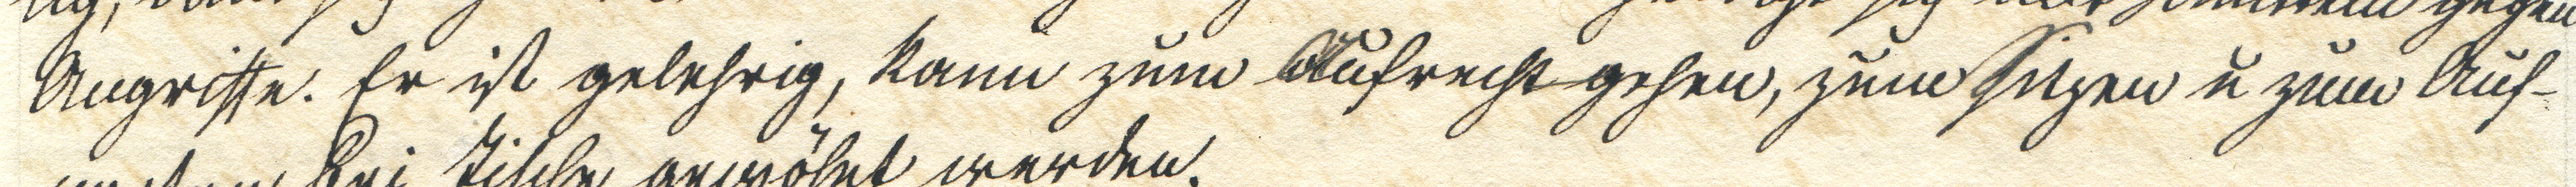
Angriffe. Er ist gelehrig, kann zum aAufrecht-gehen, zum sSitzen u zum Auf-
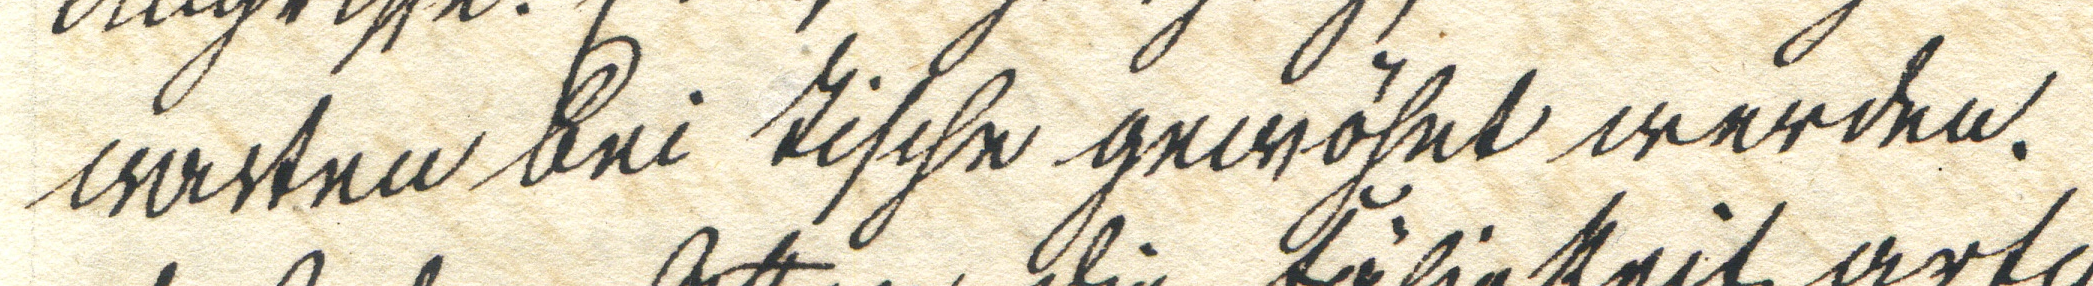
warten bei Tische gewöhnt werden.
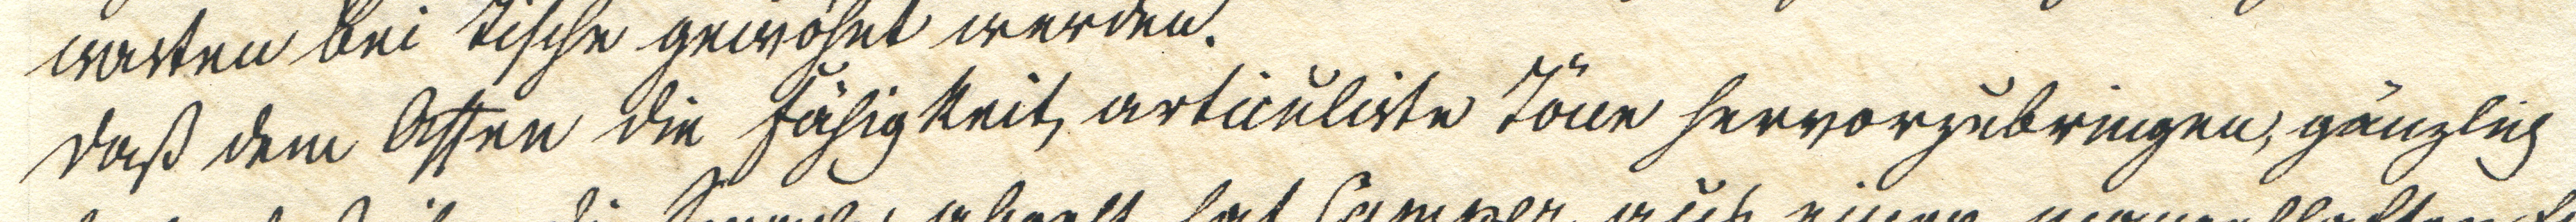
Daß dem Affen die Fähigkeit, articulirte Töne hervorzubringen, gänzlich
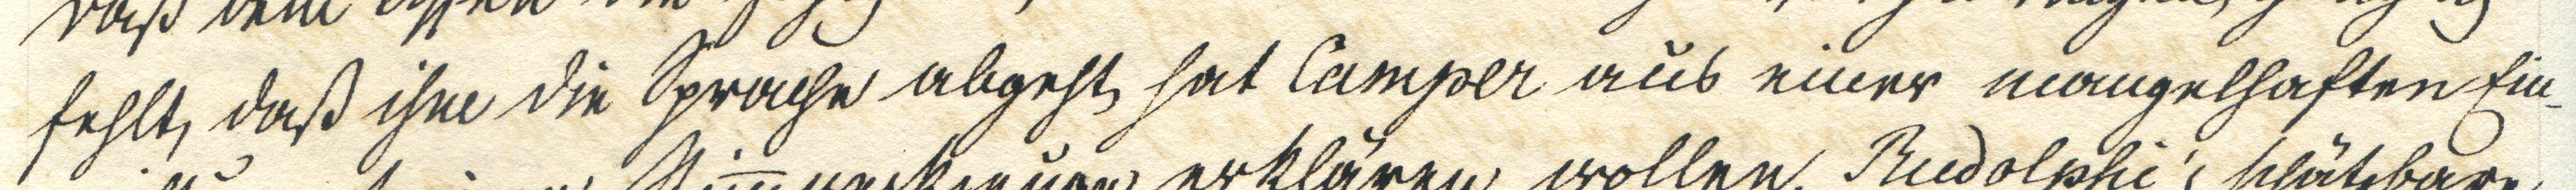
fehlt, daß ihm die Sprache abgeht, hat Camper aus einer mangelhaften Ein-
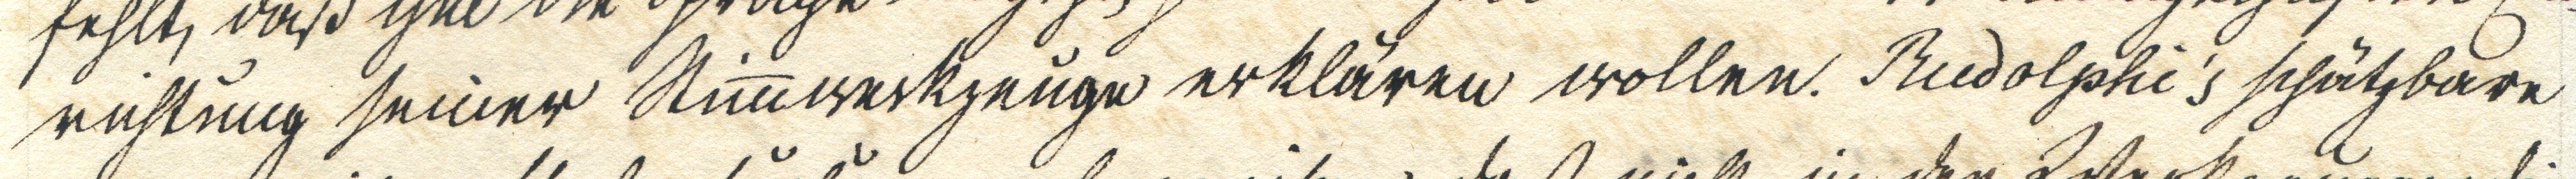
richtung seiner Stim̃werkzeuge erklären wollen. Rudolphi’s schätzbare
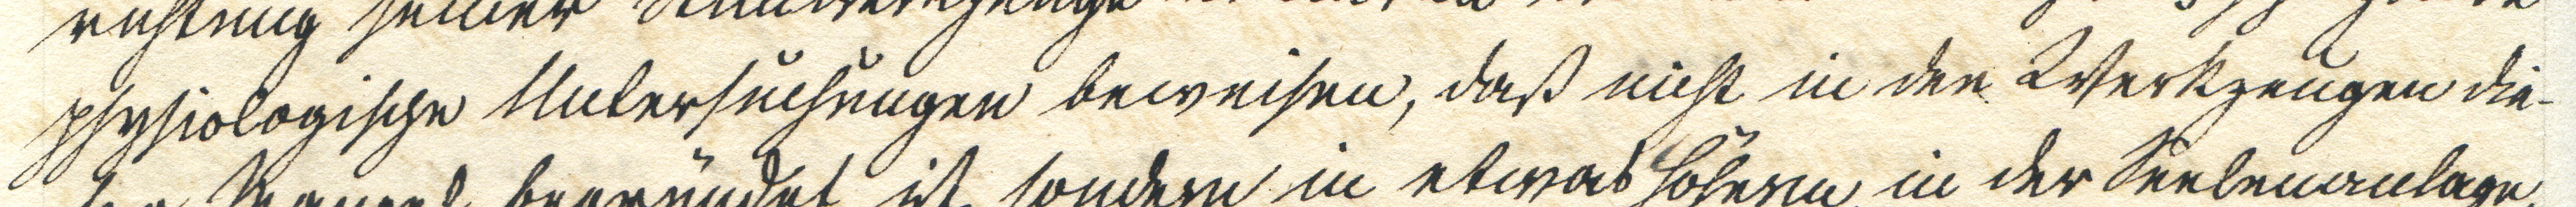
physiologische Untersuchungen beweisen, daß nicht in den Werkzeugen die-
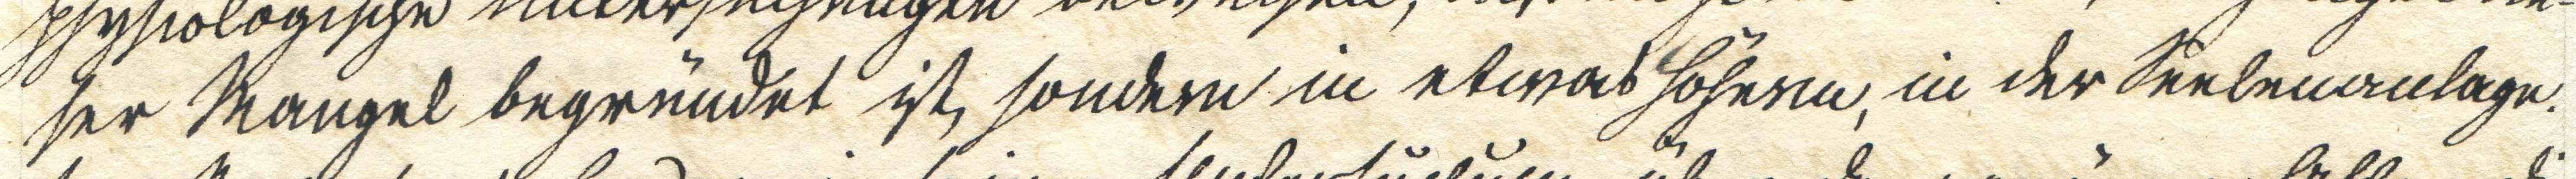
ser Mangel begründet ist, sondern in etwas höherm, in der Seelenanlage.
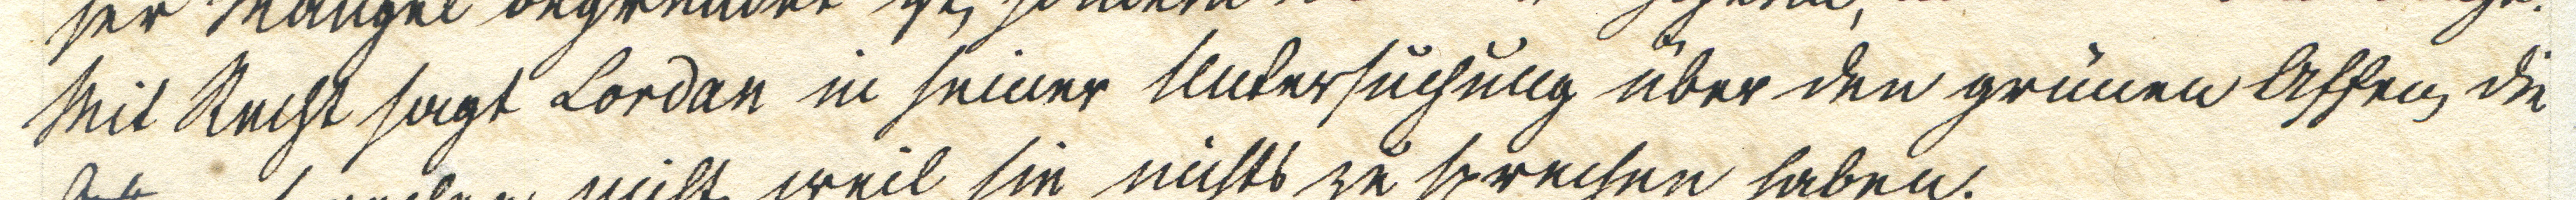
Mit Recht sagt Lordan in seiner Untersuchung über den grünen Affen, die
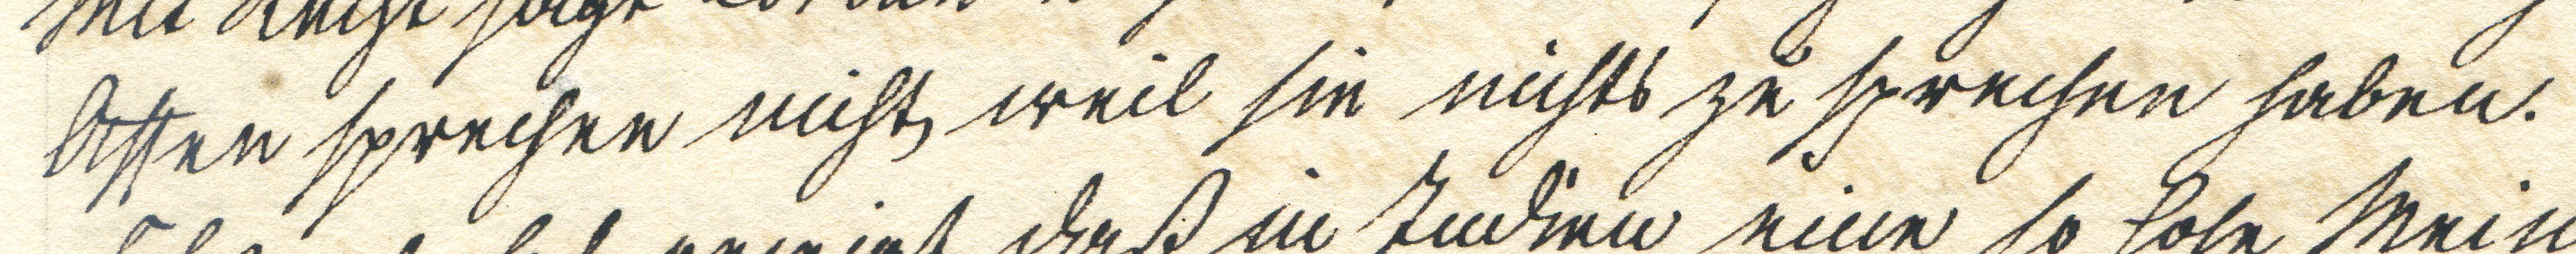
Affen sprechen nicht, weil sie nicht zu sprechen haben.
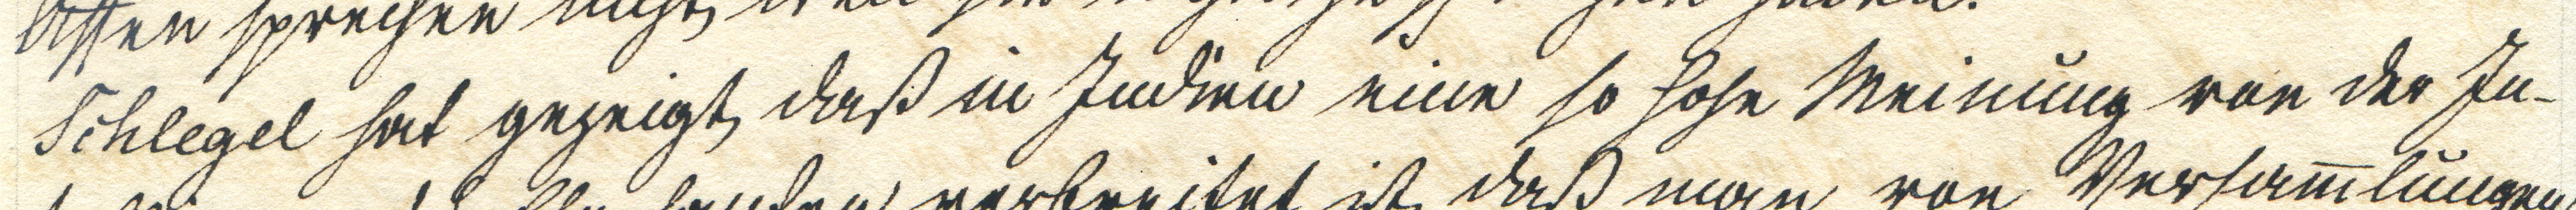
Schlegel hat gezeigt, daß in Indien eine so hohe Meinung von der In-
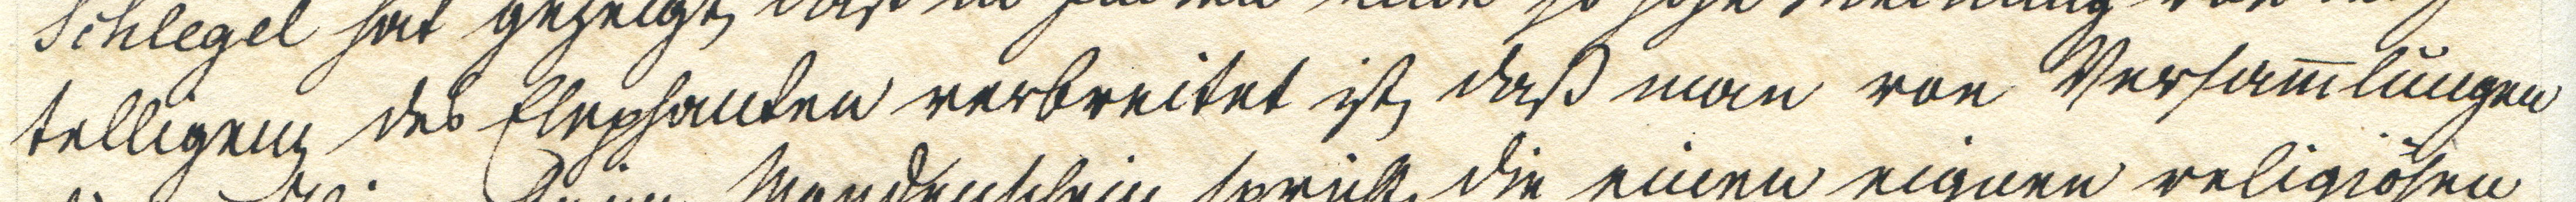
telligenz des Elephanten verbreitet ist, daß man von Versam̃lungen
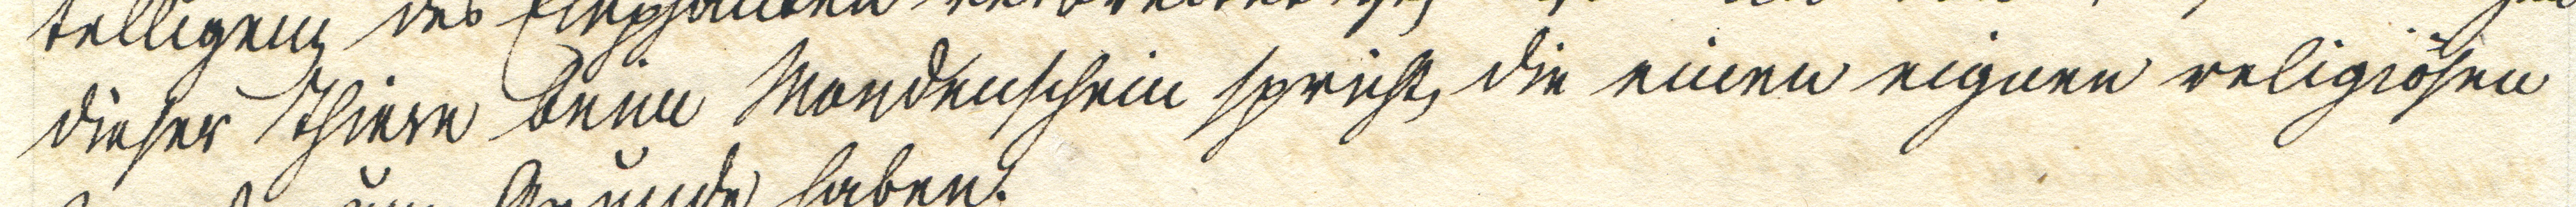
dieser Thiere beim Mondenschein spricht, die einen eignen religiösen
